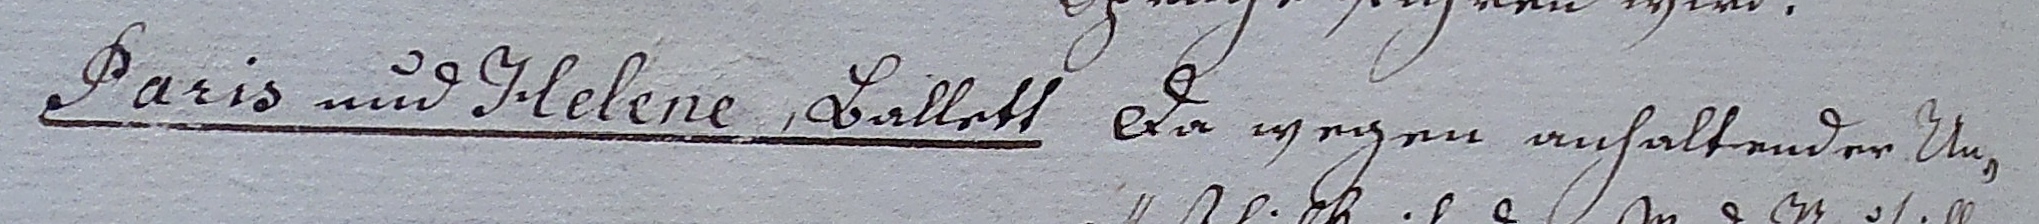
Paris und Helene, Ballet Da wegen anhaltender Un¬
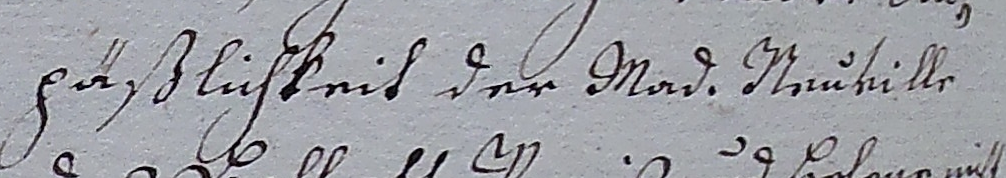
päßlichkeit der Mad. Neuville
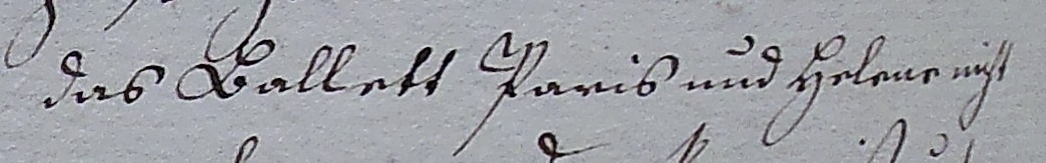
das Ballett Paris und Helene nicht
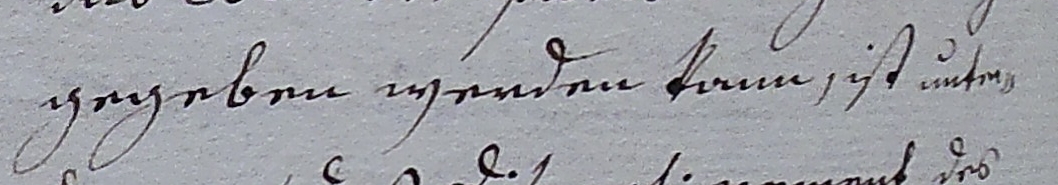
gegeben werden kann, ist unter¬
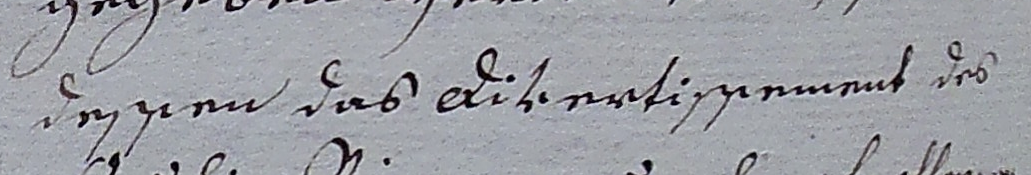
dessen das Divertissement des
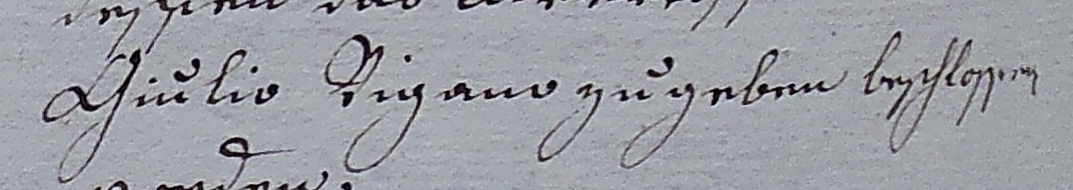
Giulio Vigano zugeben bschlossen
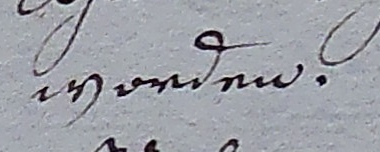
worden.
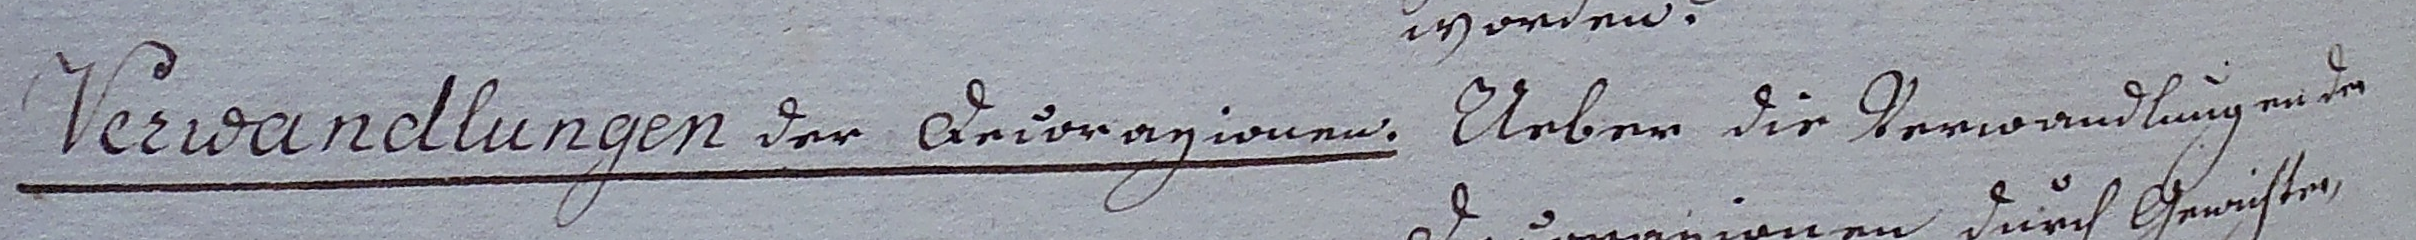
Verwandlungen der Decorazionen. Ueber die Verwandlungen der
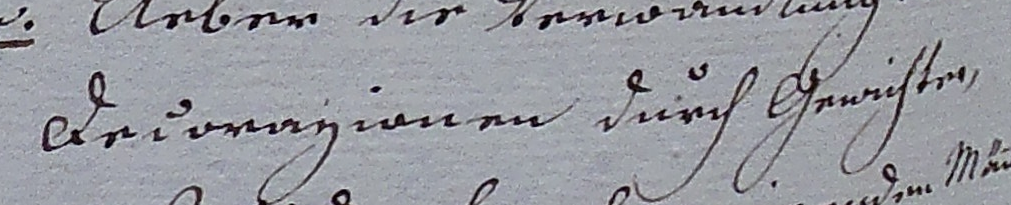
Decorazionen durch Gewichten,
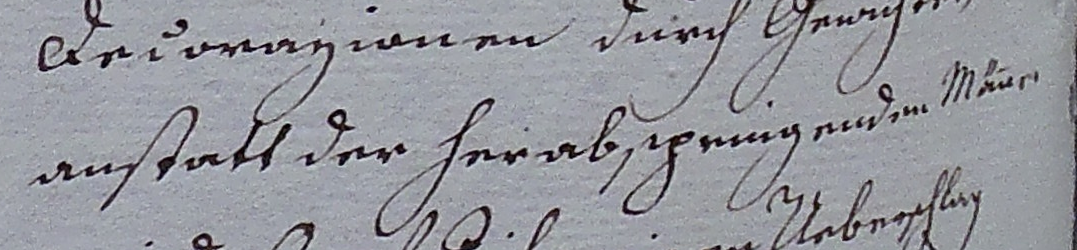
anstatt der herabspringenden Män̅er
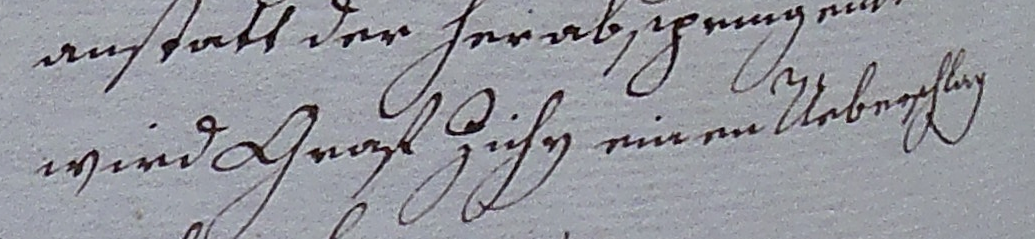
wird Graf Zichy einen Ueberschlag
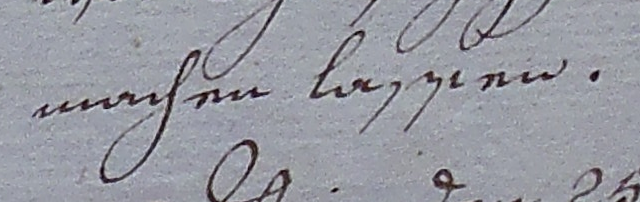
machen lassen.
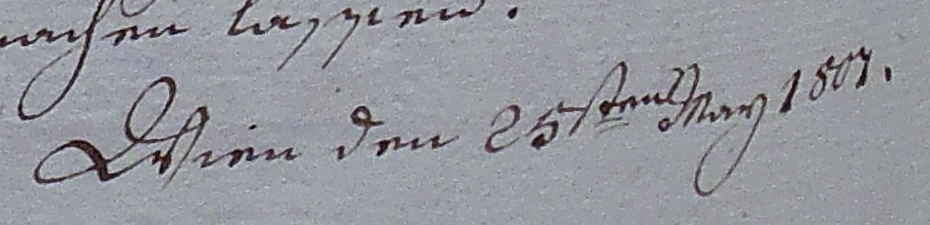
Wien den 25ste͇n May 1807.
